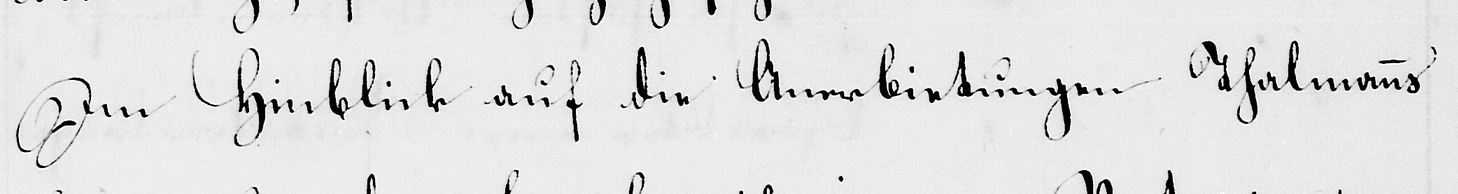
Im Hinblick auf die Anerbietungen Thalmanns
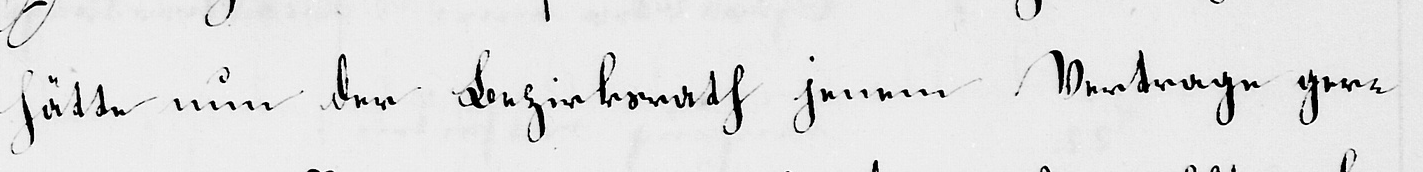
hätte nun der Bezirksrath jenem Vertrage ger¬
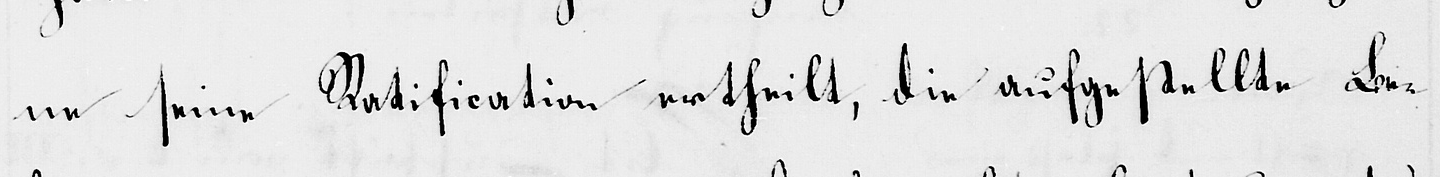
ne seine Ratification ertheilt, die aufgestellte Be¬
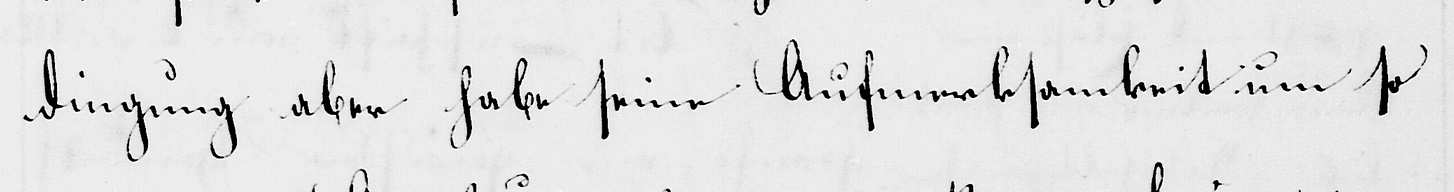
dingung aber habe seine Aufmerksamkeit um so
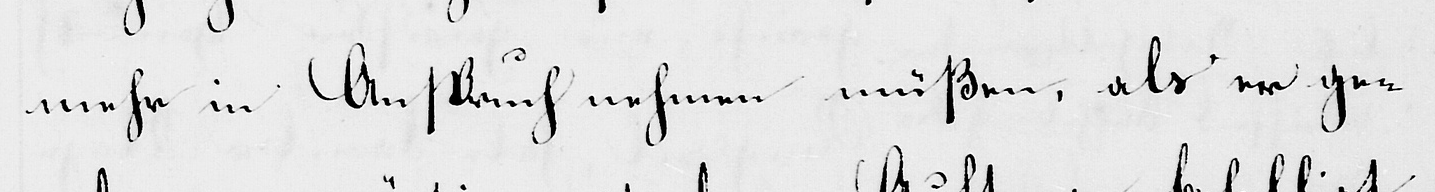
mehr in Anspruch nehmen müßen, als er ge¬
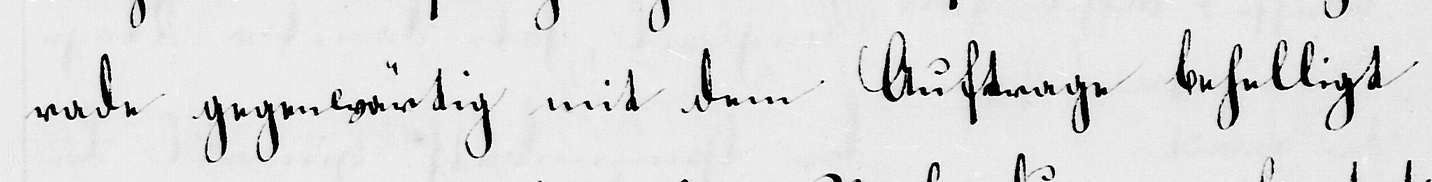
rade gegenwärtig mit dem Auftrage behelligt
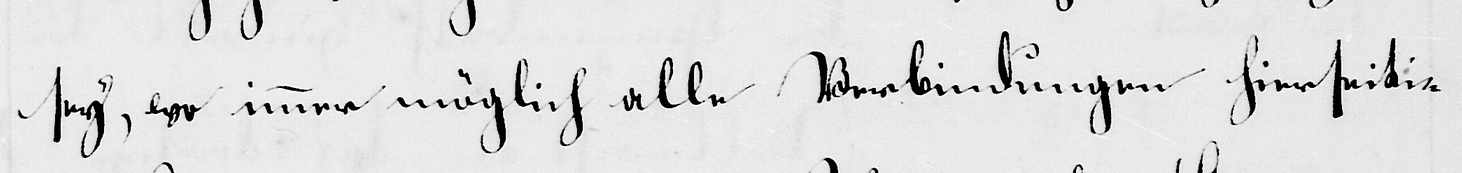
sey, wo immer möglich alle Verbindungen hierseiti¬
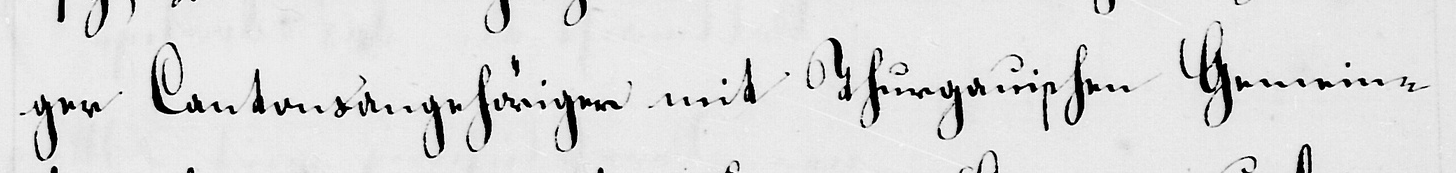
ger Cantonsangehöriger mit Thurgauischen Gemein¬
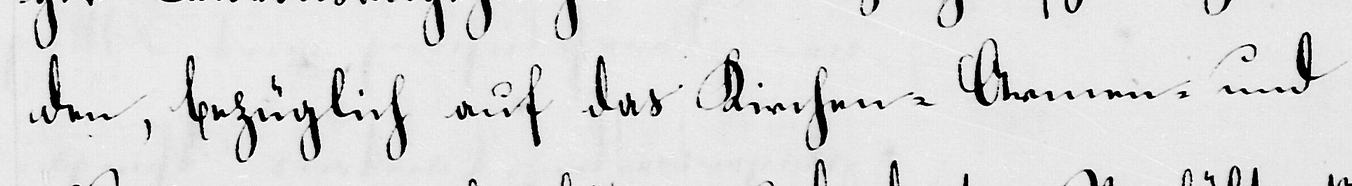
den, bezüglich auf das Kirchen- Armen- und
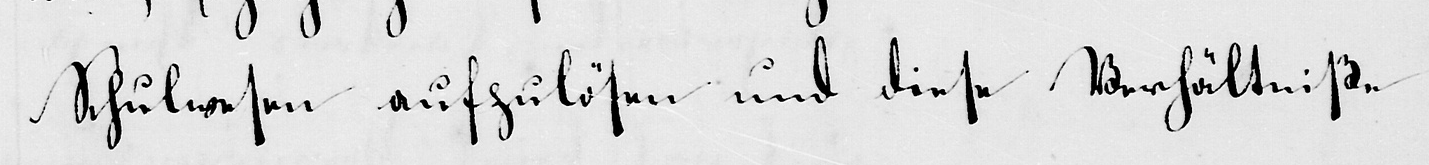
Schulwesen aufzulösen und diese Verhältniße
